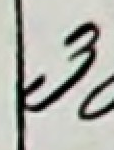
3
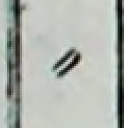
„
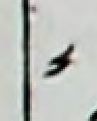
„
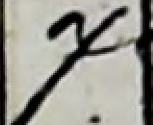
7
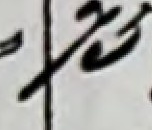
75
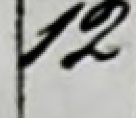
12
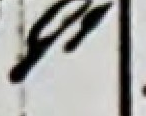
91
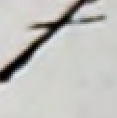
7
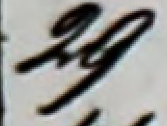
29
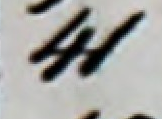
41
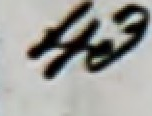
43
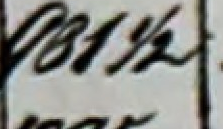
931 1/2
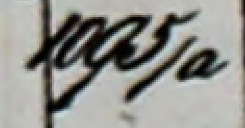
1095/a
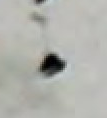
„
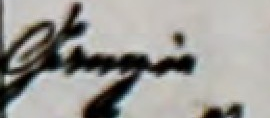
Ganzie
